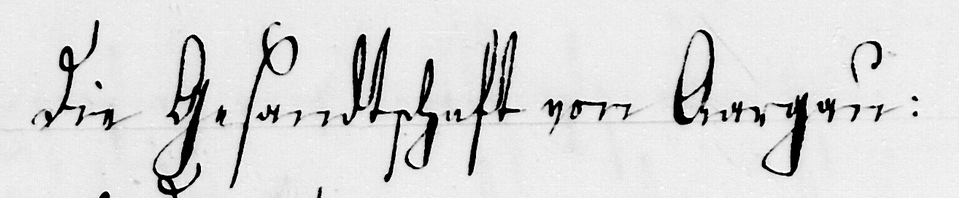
Die Gesandtschaft von Aargau:
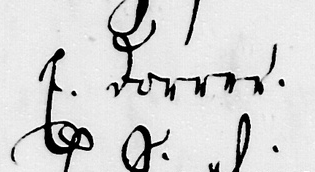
E. Dorrer.
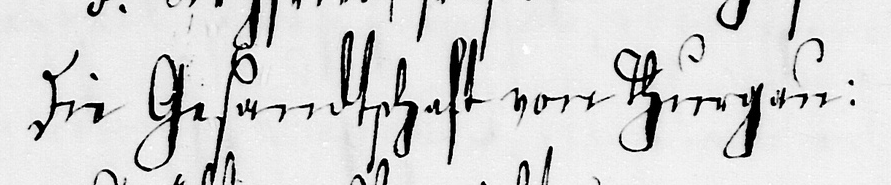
Die Gesandtschaft von Thurgau:
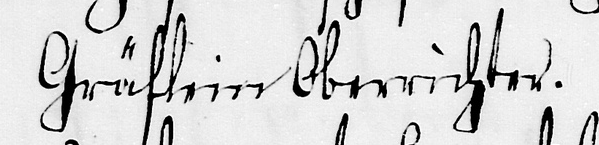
Gräflein Oberrichter.
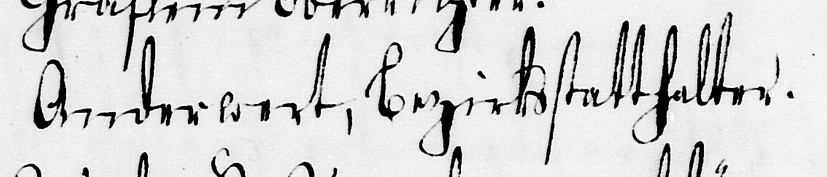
Anderwert, Bezirksstatthalte¬
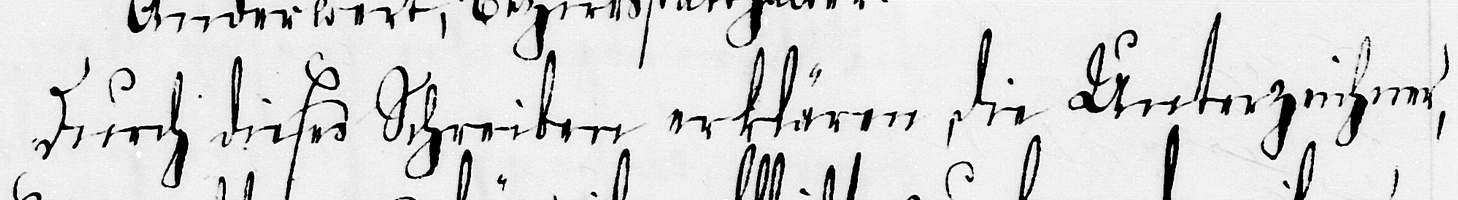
Durch dieses Schreiben erklären die Unterzeichne¬
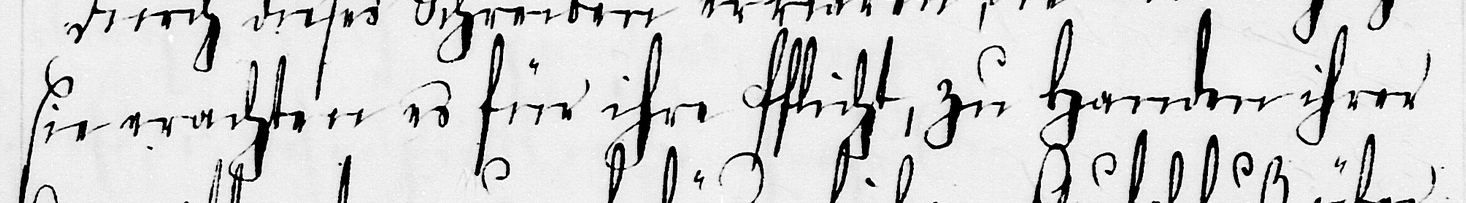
sie erachten es für ihre Pflicht, zu Handen ihrer
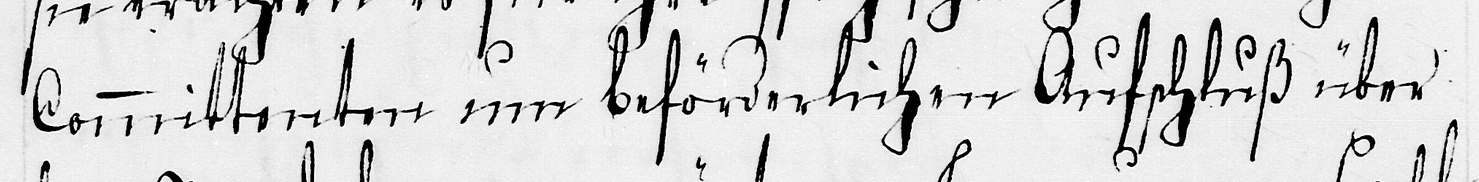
Committenten um beförderlichen Aufschluß über
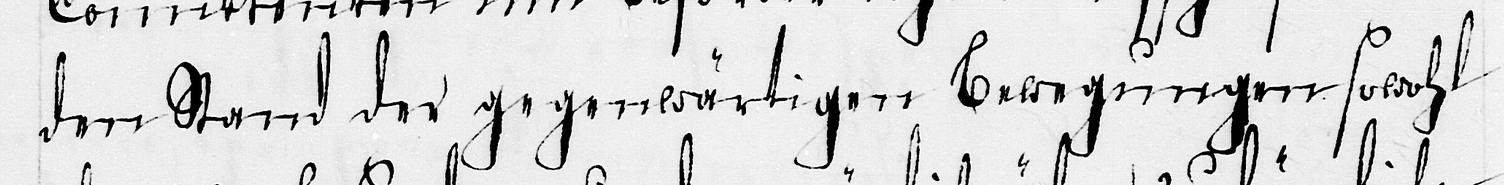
den Stand der gegenwärtigen Bewegungen sowohl
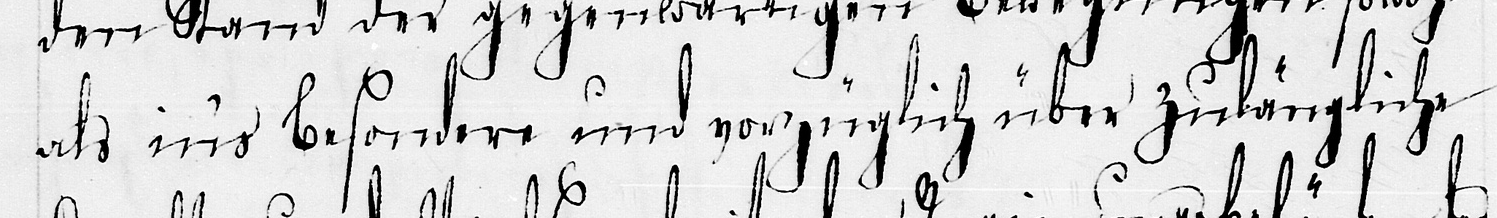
als in’s Besondere und vorzüglich über zulängliche
